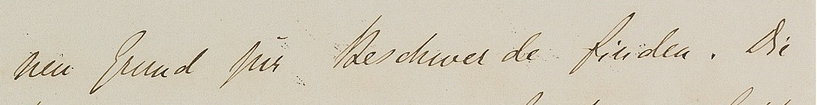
nen Grund zur Beschwerde finden. Die
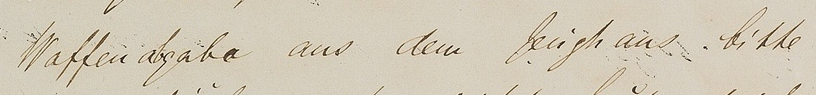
Waffenabgabe aus dem Zeughaus bitte
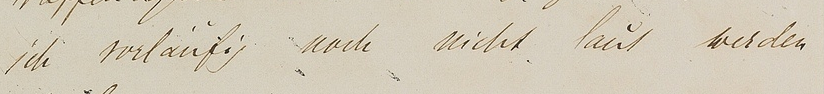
ich vorläufig noch nicht laut werden
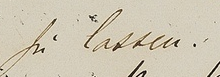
zu lassen.
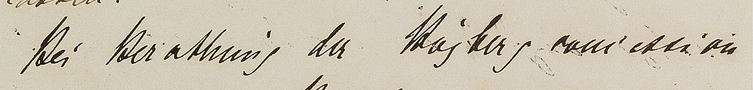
Bei Berathung der Bözbergconzession
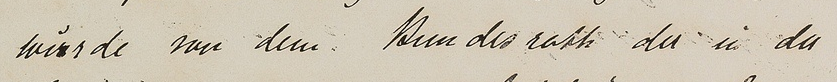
wurde von dem Bundesrath der in der
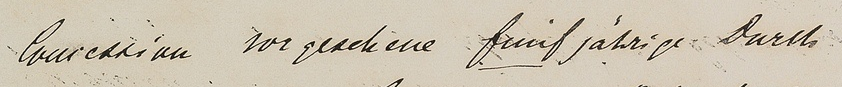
Conzession vorgesehene fünfjährige Durch-
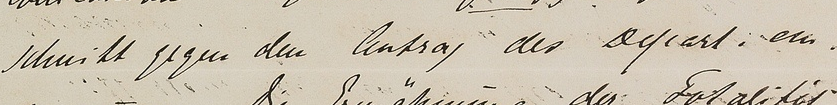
schnitt gegen den Antrag des Depart. an-
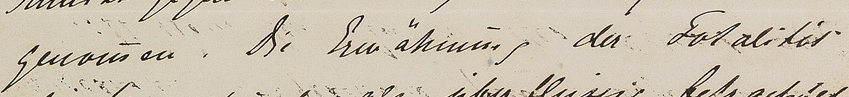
genommen. Die Erwähnung der Totalität
